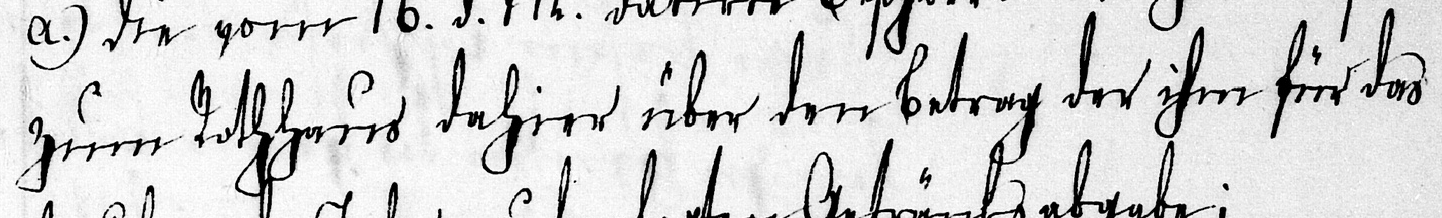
zum Rathhaus dahier über den Betrag der ihm für das
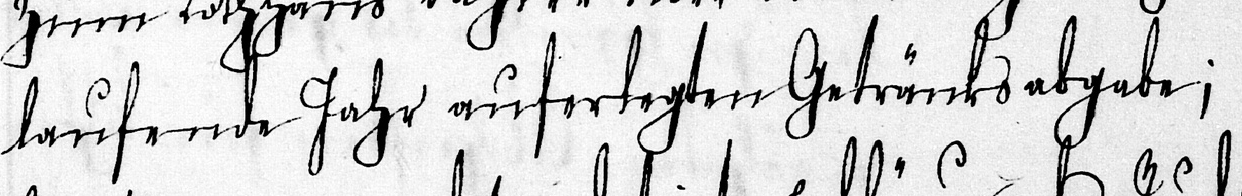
laufende Jahr auferlegten Getränksabgabe;
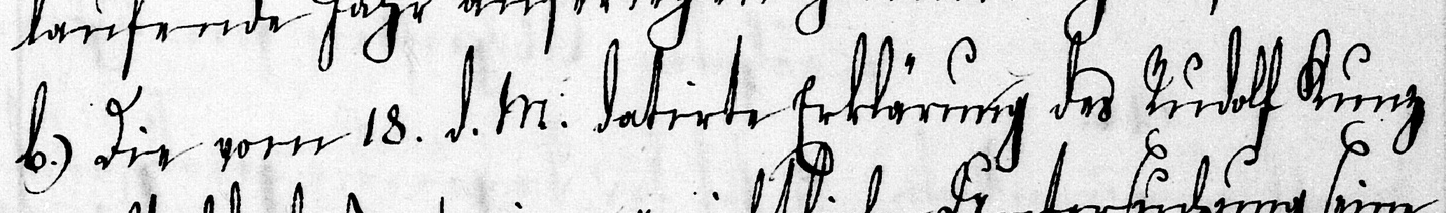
b.) Die vom 18. d. M. datirte Erklärung des Rudolf Kunz
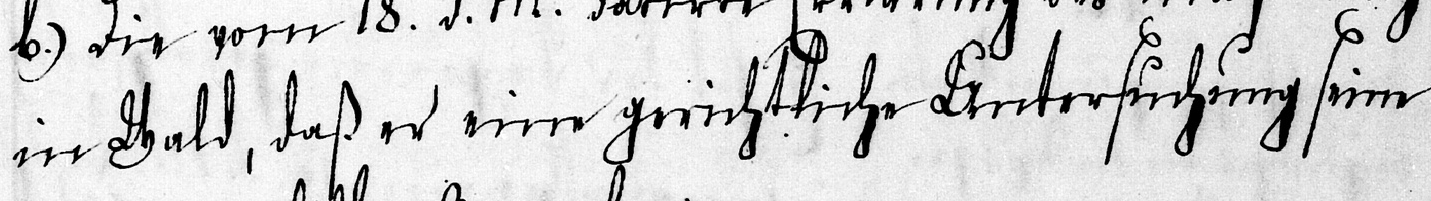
in Wald, daß er eine gerichtliche Untersuchung seine
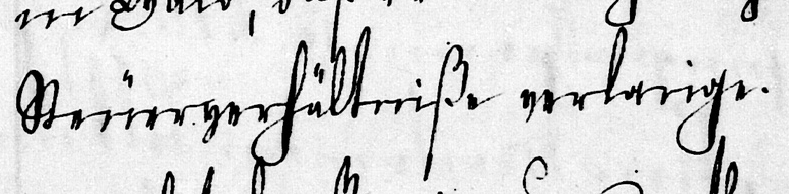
Steuerverhältniße verlange.
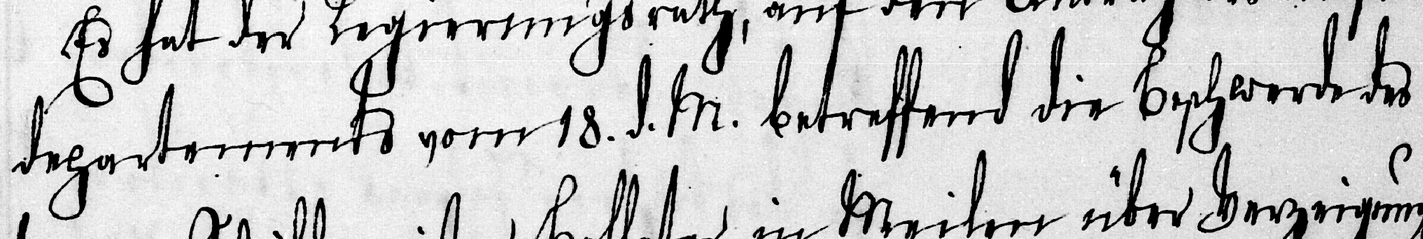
departements vom 18. d. M. betreffend die Beschwerde
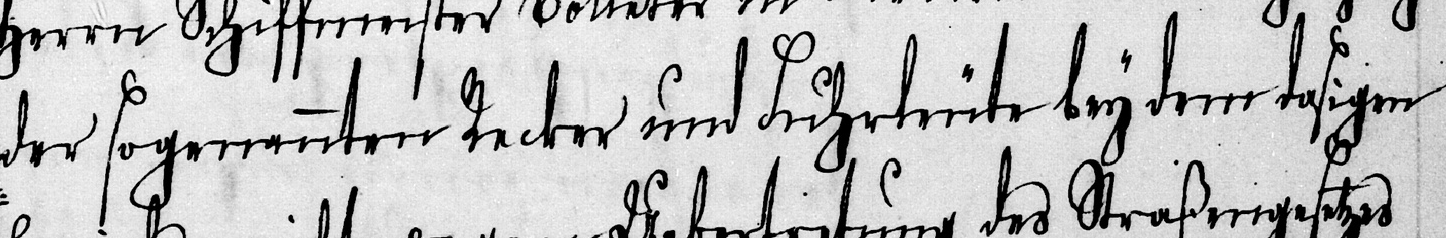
der sogenannten Recker und Fuhrleute bey dem dasigen
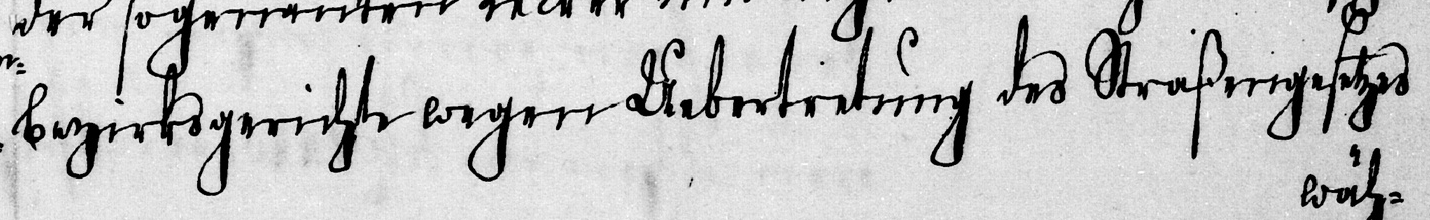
Bezirksgerichte wegen Uebertretung des Straßengesetzes
